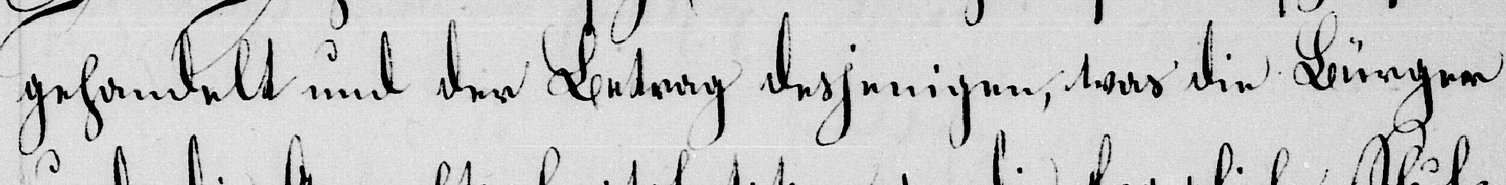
gehandelt und der Betrag desjenigen, was die Bürger
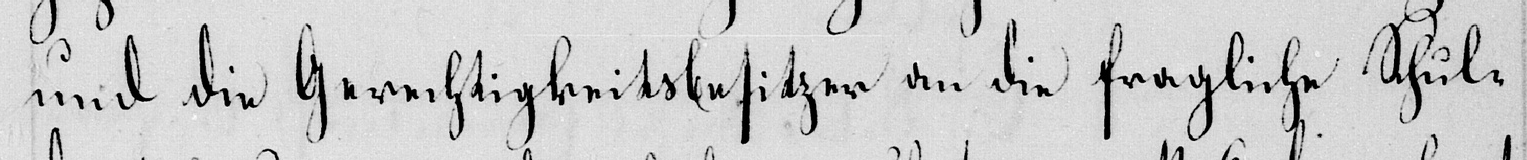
und die Gerechtigkeitsbesitzer an die fragliche Schul¬
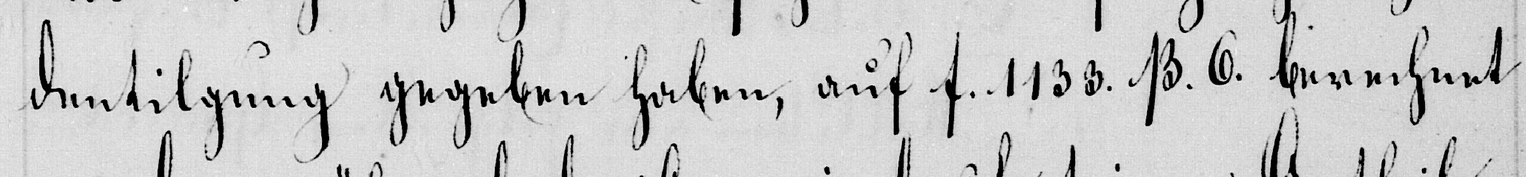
dentilgung gegeben haben, auf f. 1133. ß. 6. berechnet
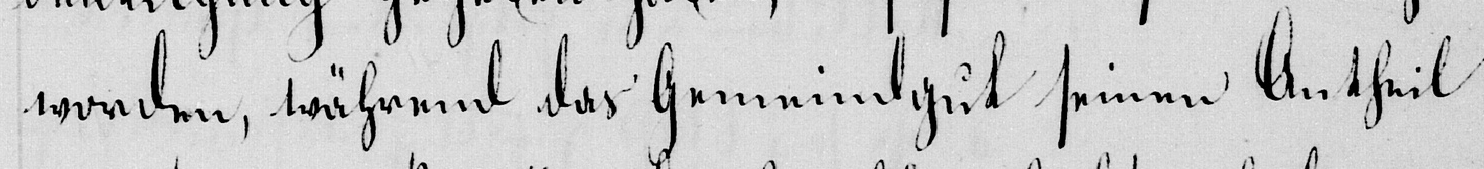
worden, während das Gemeindgut seinen Antheil
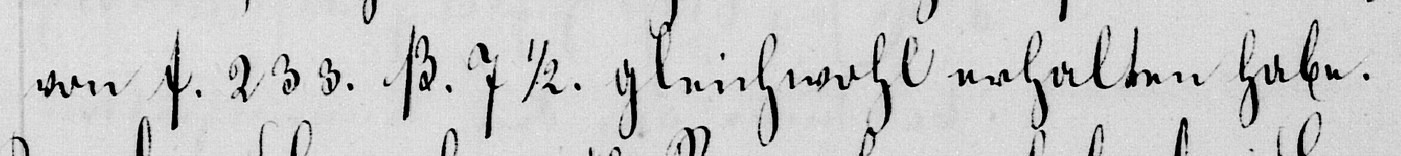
von f. 233. ß. 7. ½. gleichwohl erhalten habe.
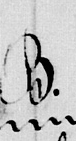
3.
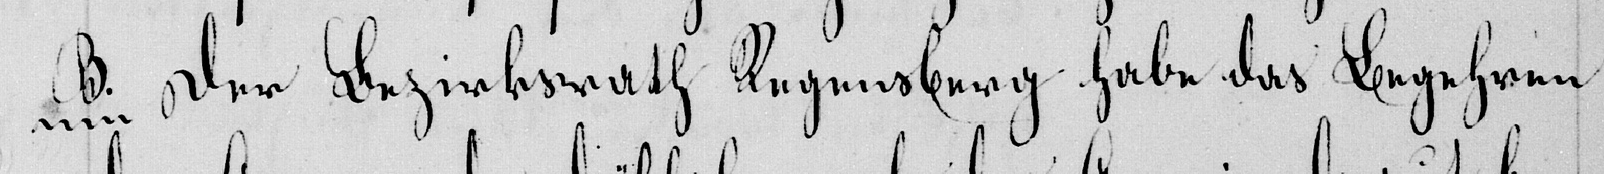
B. Der Bezirksrath Regensberg habe das Begehren
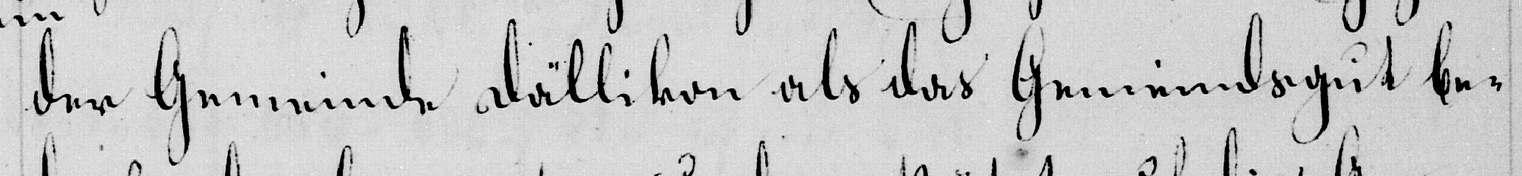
der Gemeinde Dällikon als das Gemeindsgut be¬
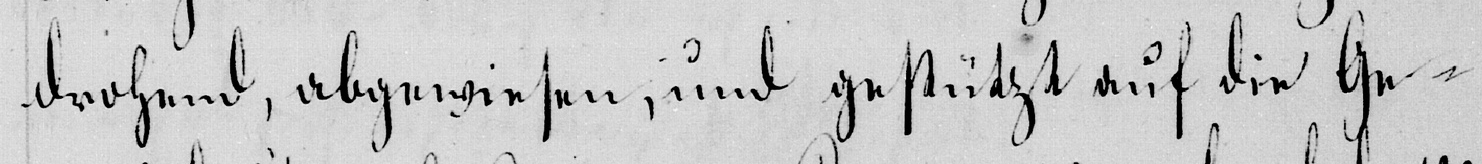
drohend, abgewiesen, und gestützt auf die Ge¬
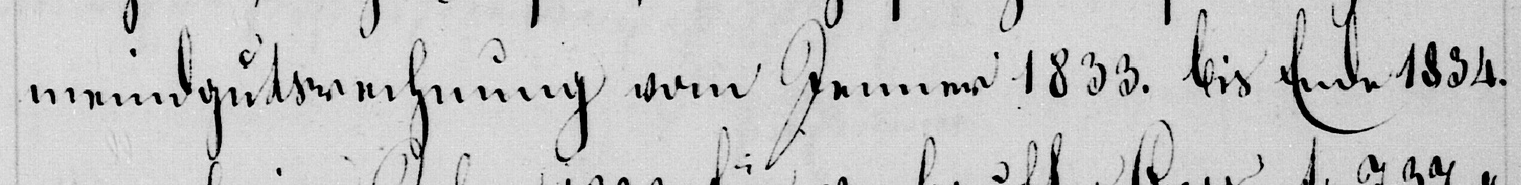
meindgutsrechnung vom Jenner 1833. bis Ende 1834.
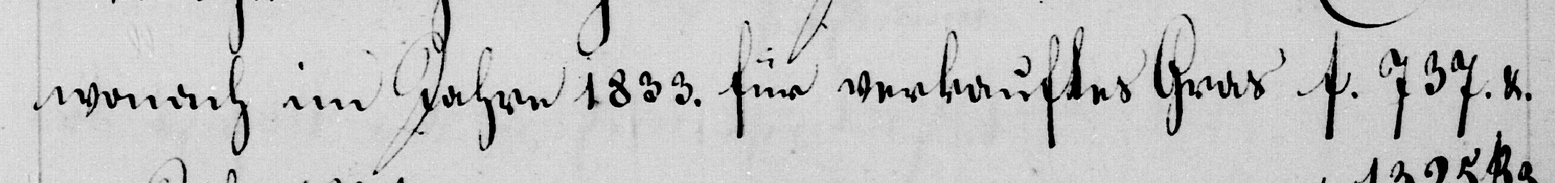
wonach im Jahre 1833. für verkauftes Gras f. 737. &.
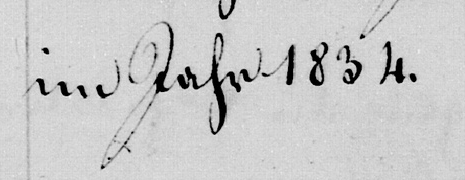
im Jahr 1834.
